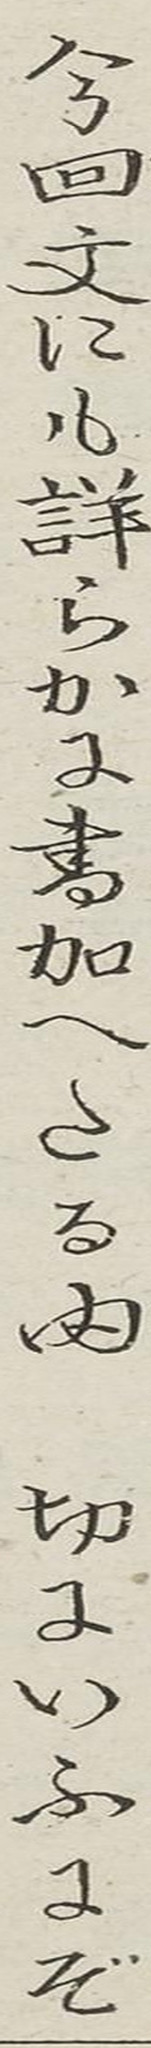今回文にも詳らかに書加へたる由切にいふにぞ
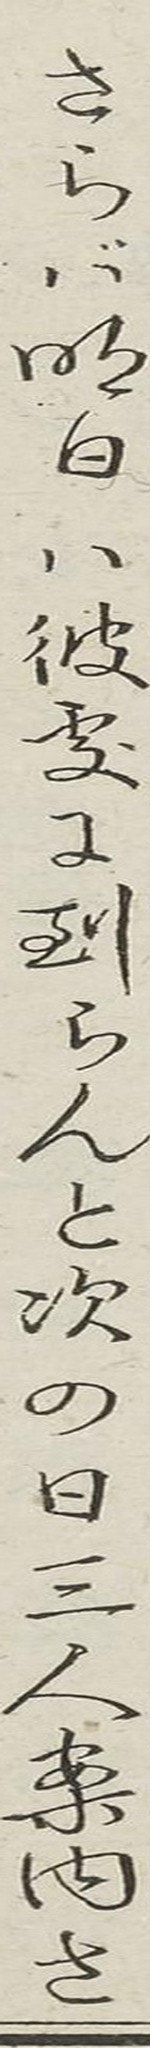さらば明日は彼處に到らんと次の日三人案内さ
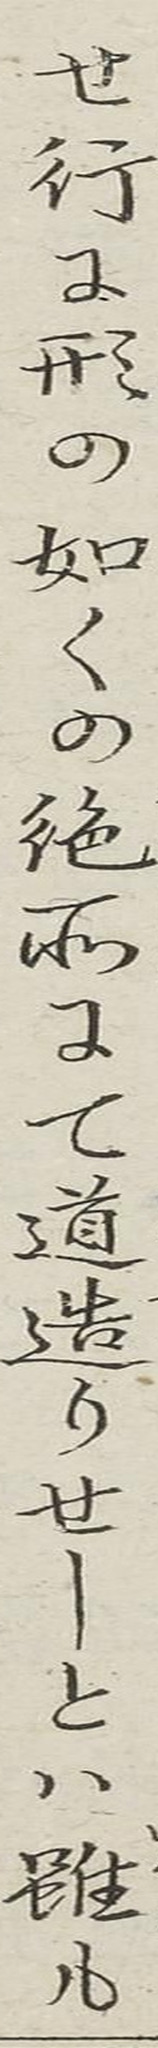せ行に形の如くの絶所にて道造りせしとは雖も
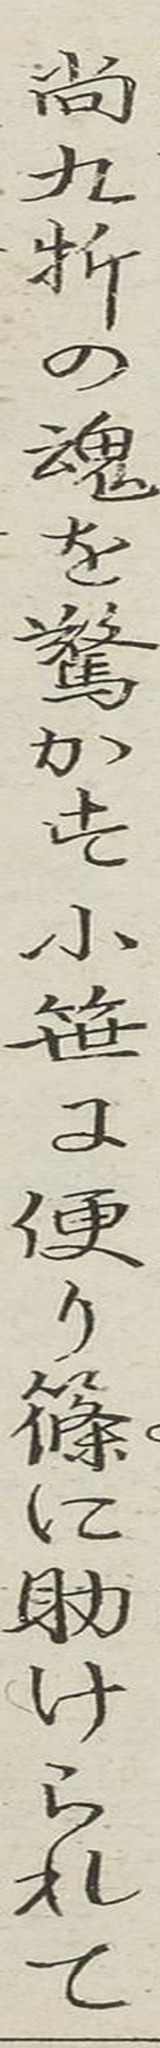尚九折の魂を驚かす小笹に便り篠に助けられて
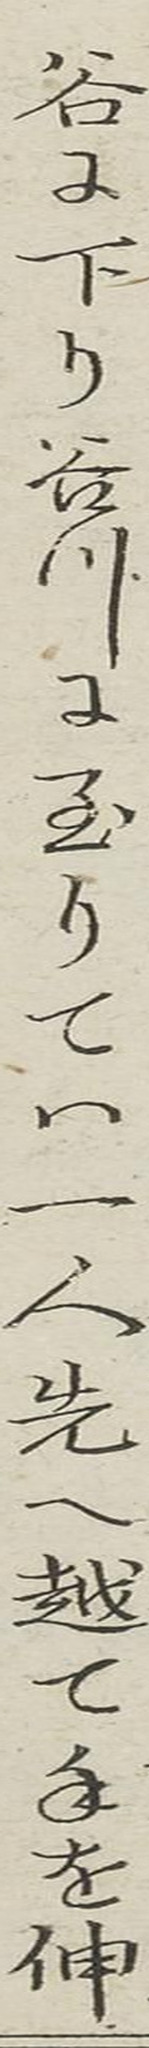谷に下り谷川に至りては一人先へ越て手を伸

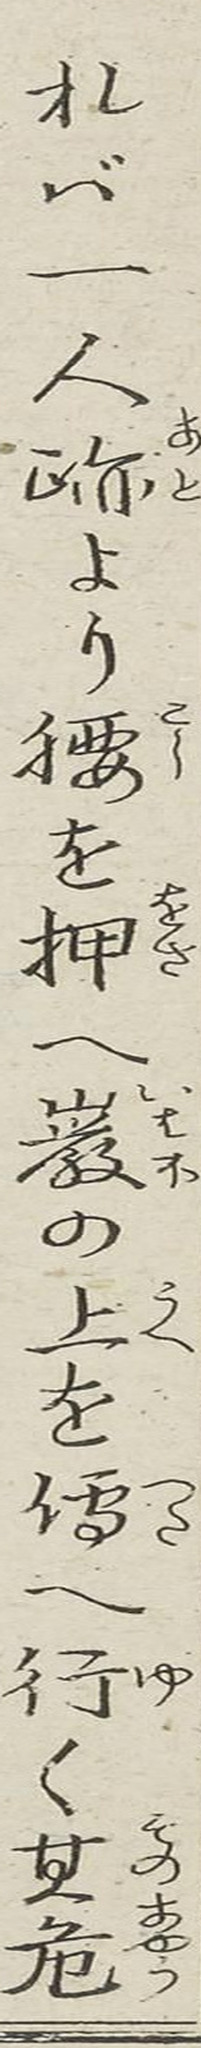れば一人跡より腰を押へ巌の上を伝へ行く其危
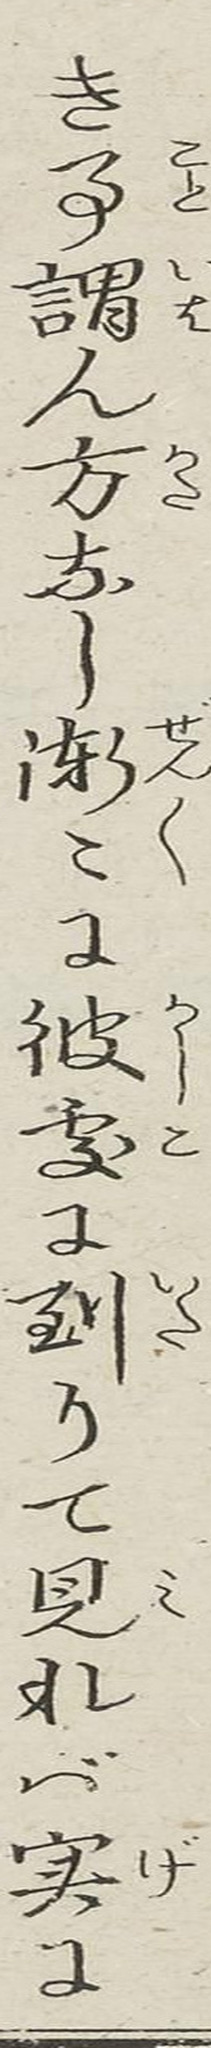き事謂ん方なし漸〻に彼處に到りて見れば実に
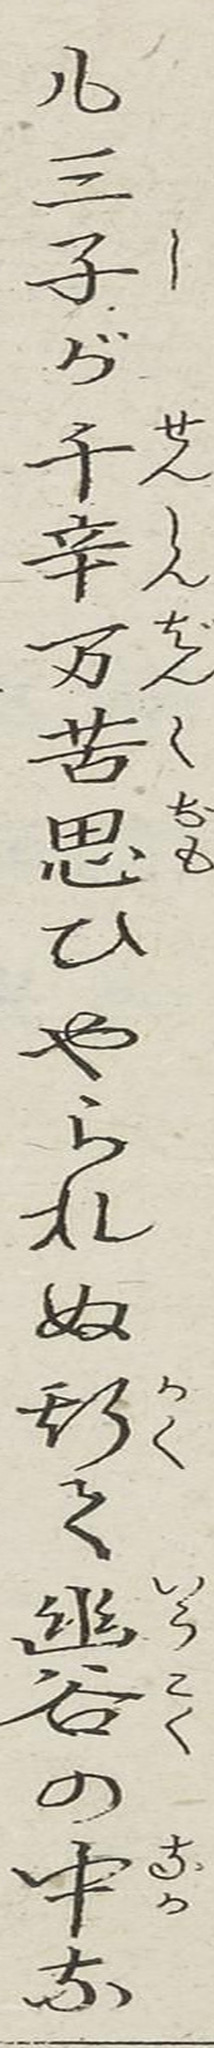も三子が千辛万苦思ひやられぬ斯て幽谷の中な
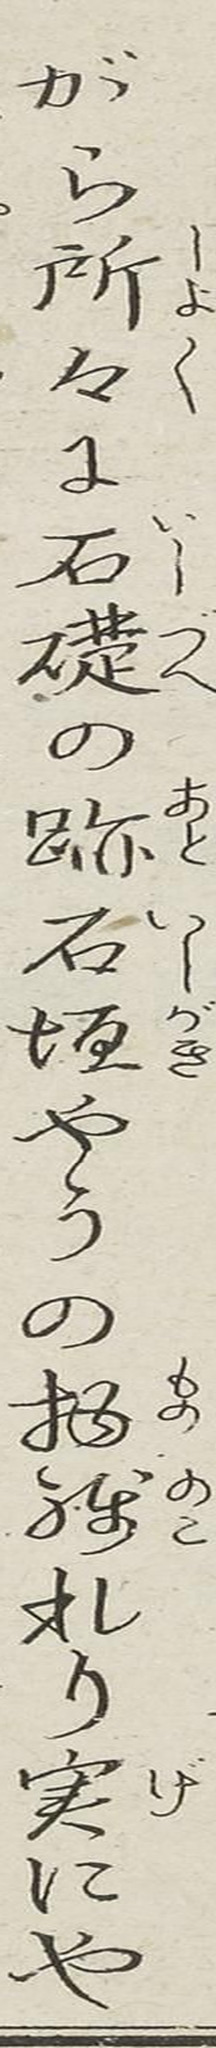がら所々に石礎の跡石垣やうの物残れり実にや
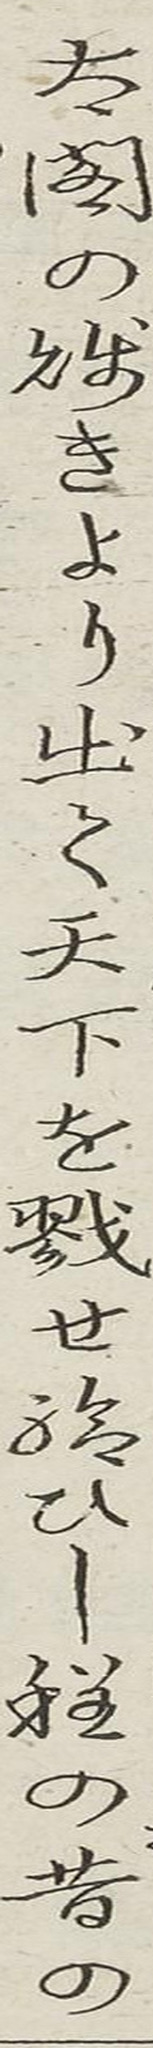太閤の賎きより出て天下を戮せ給ひし程の昔の
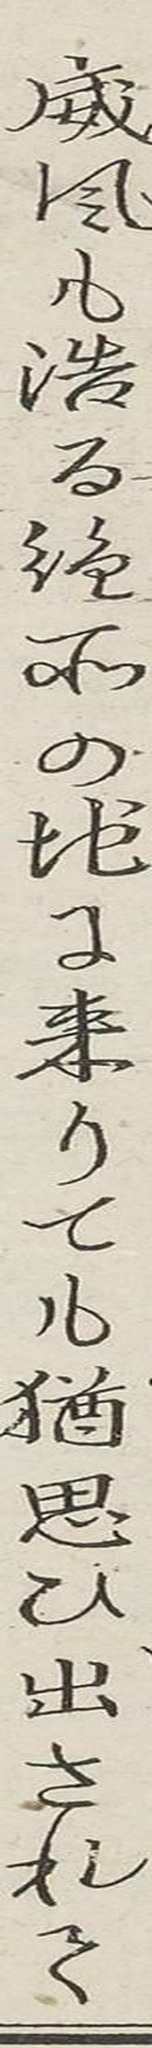威風も浩る絶所の地に来りても猶思ひ出されて
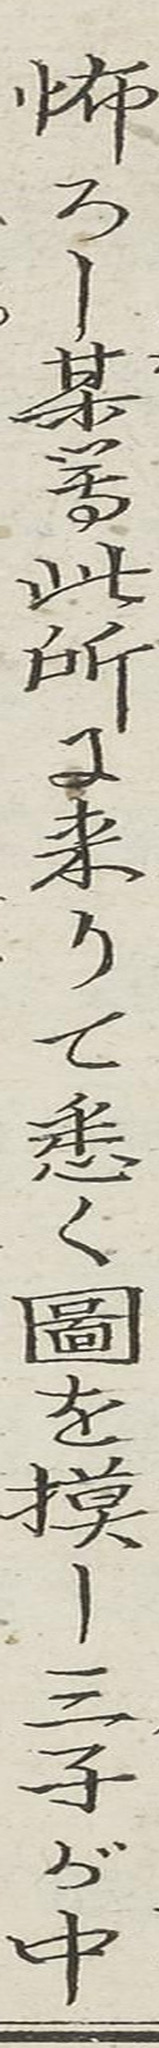怖ろし某等此所に来りて悉く圖を模し三子が中
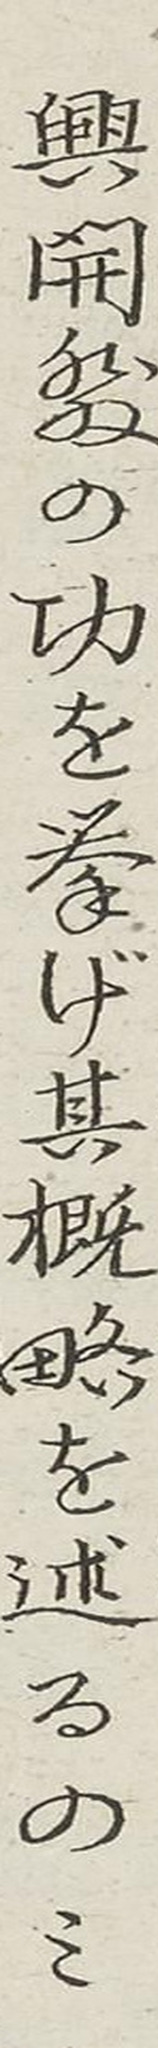興開発の功を挙げ其概略を述るのみ
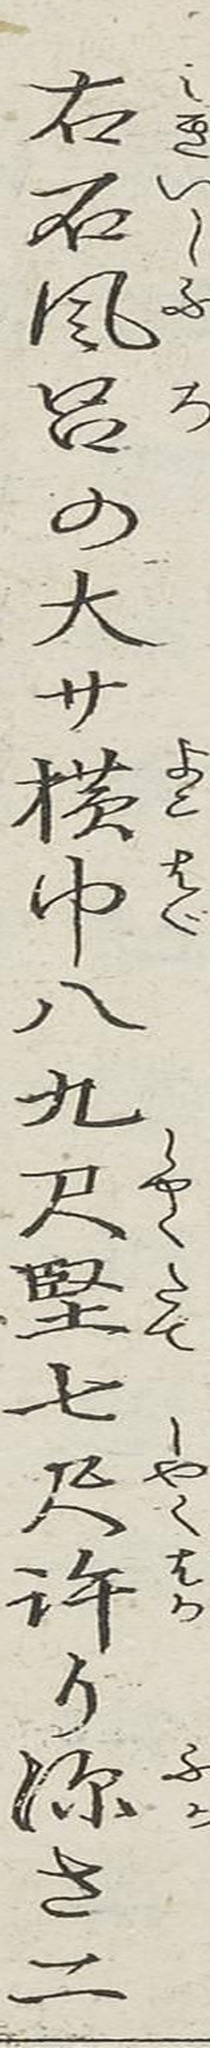右石風呂の大サ横巾八九尺竪七尺許り深さ二
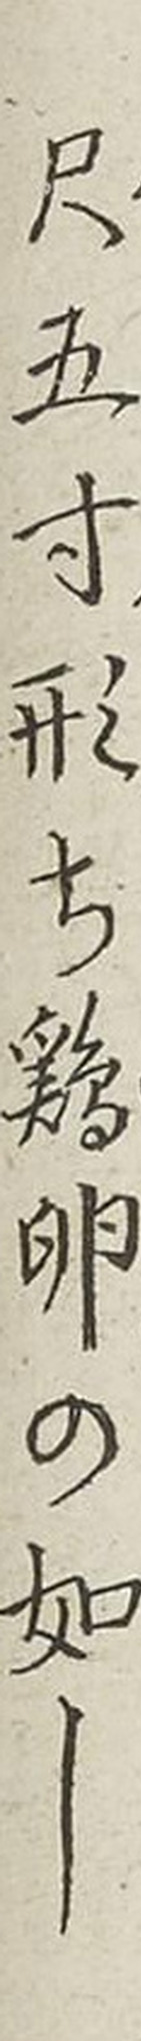尺五寸形ち鶏卵の如し
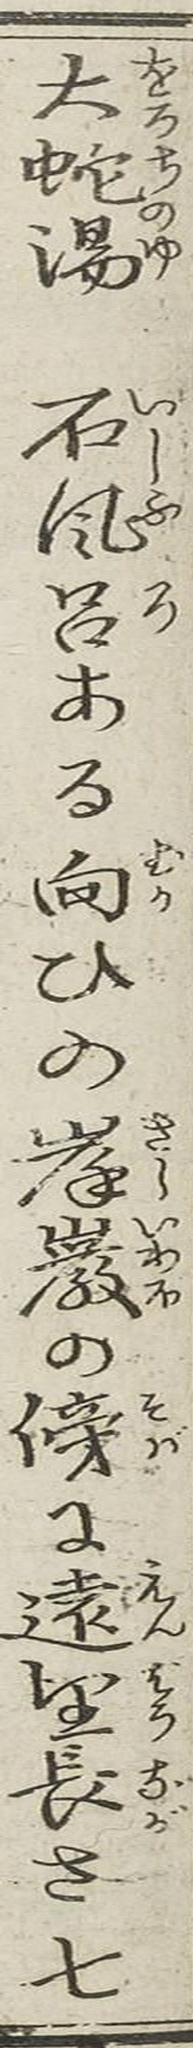大蛇湯石風呂ある向ひの岸巌の傍に遠望長さ七
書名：箱根温泉誌　全
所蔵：東京大学地震研究所図書室 Earthquake Research Institute Library, The University of Tokyo, JAPAN
